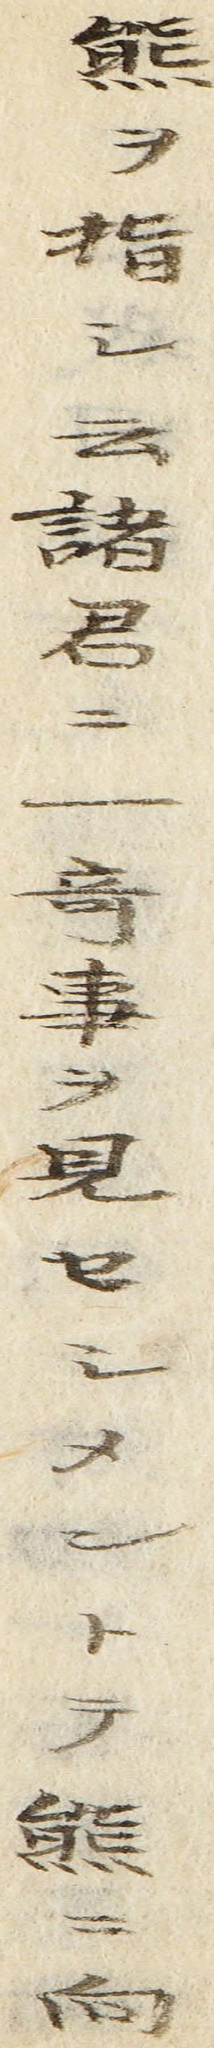熊ヲ指シ云諸君ニ一奇事ヲ見セシメントテ熊ニ向

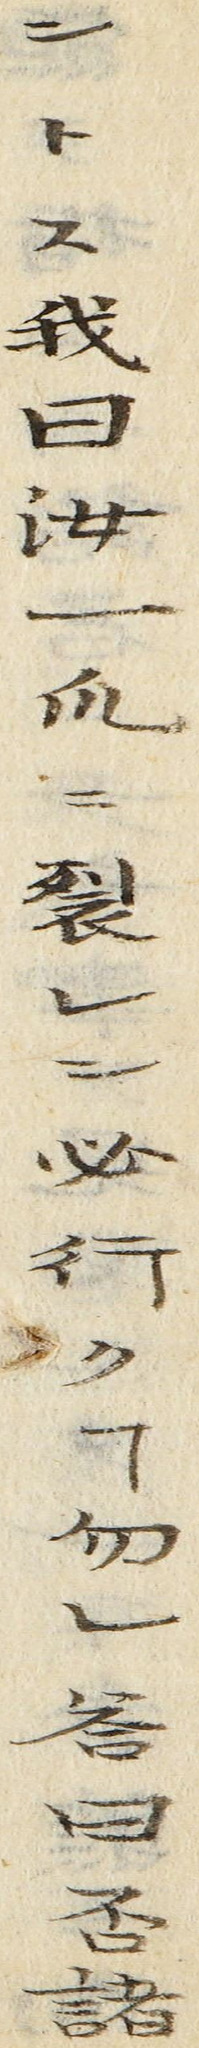ントス我曰汝一爪ニ裂レン必行クコト勿レ答曰否諸
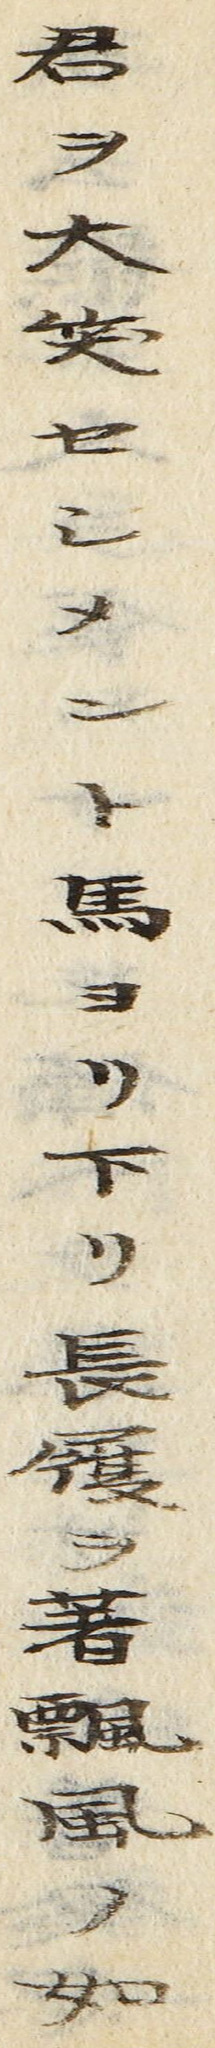君ヲ大笑セシメント馬ヨリ下リ長履ヲ著飄風ノ如
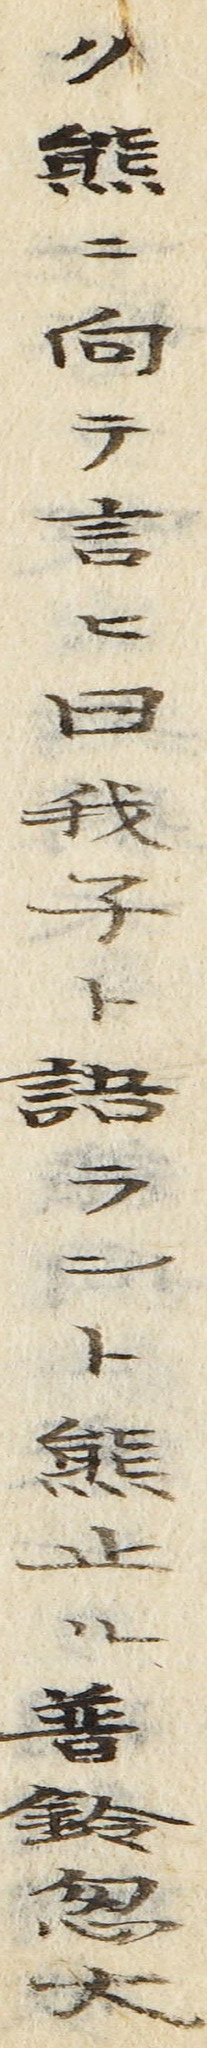ク熊ニ向テ言ヒ曰我子ト語ラント熊止ル普鈴忽大
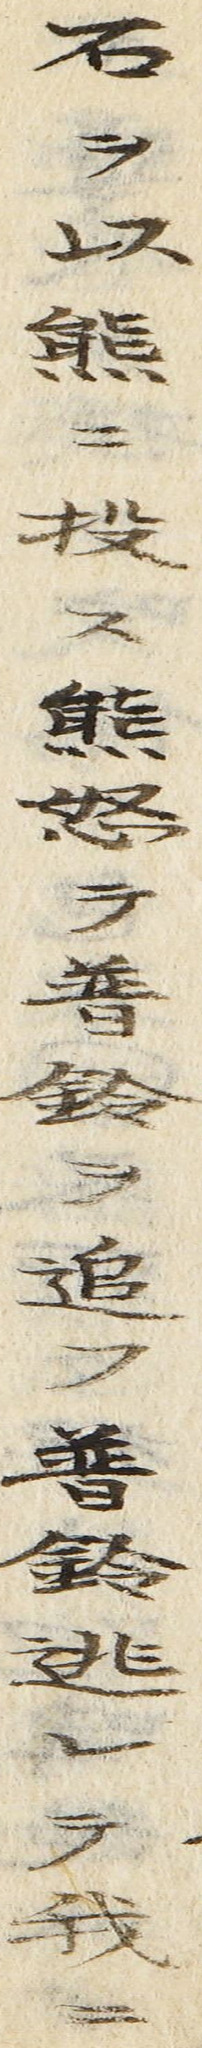石ヲ以熊ニ投ス熊怒テ普鈴ヲ追フ普鈴逃レテ我ニ
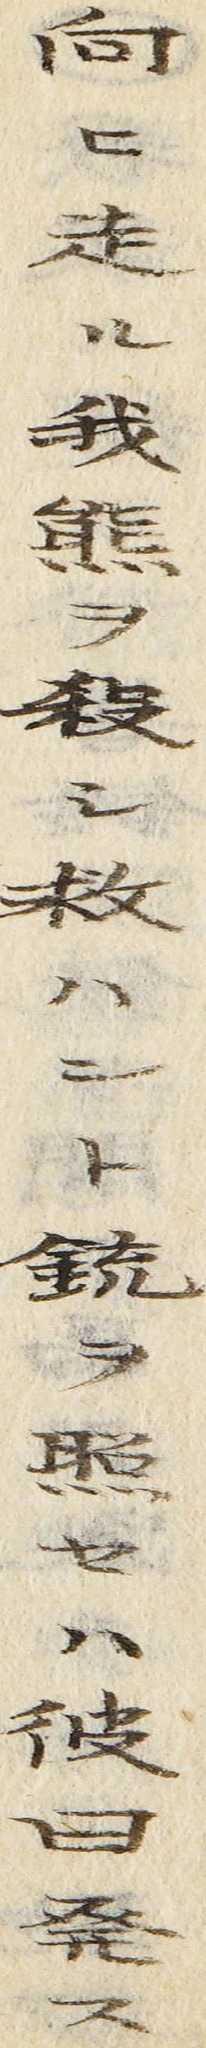向ヒ走ル我熊ヲ殺シ救ハント銃ヲ照セハ彼曰発ス
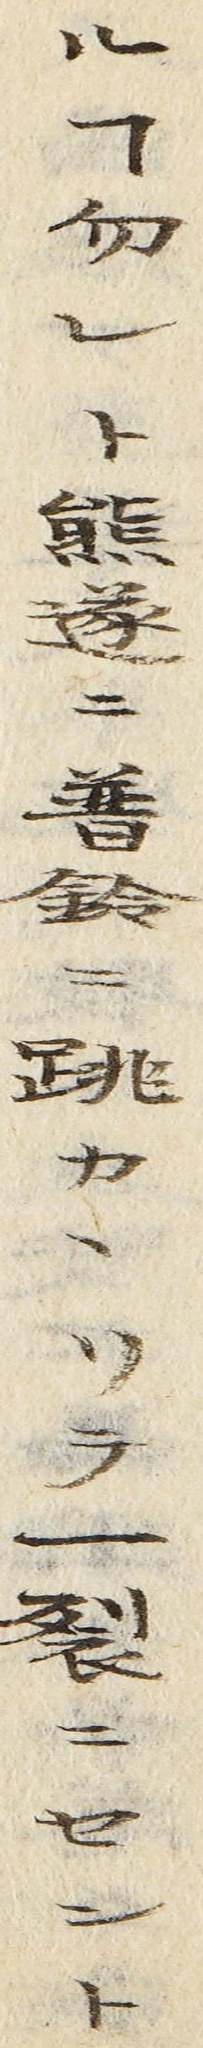ルコト勿レト熊遂ニ普鈴ニ跳カヽリテ一裂ニセント
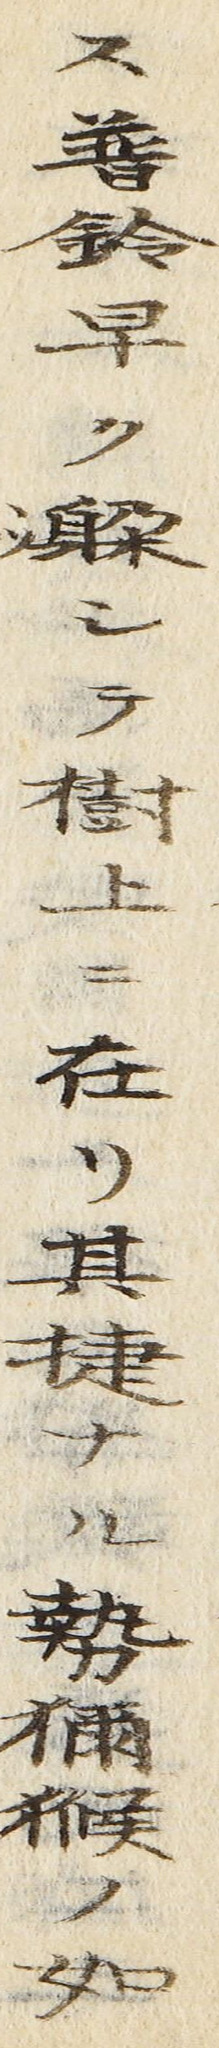ス普鈴早ク躱シテ樹上ニ在リ其捷ナル勢獮猴ノ如
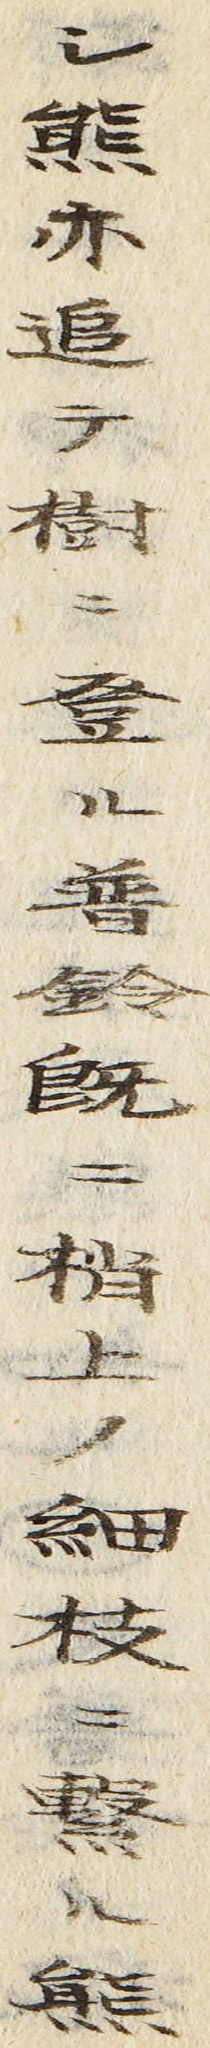シ熊亦追テ樹ニ登ル普鈴既ニ梢上ノ細枝ニ繋ル熊
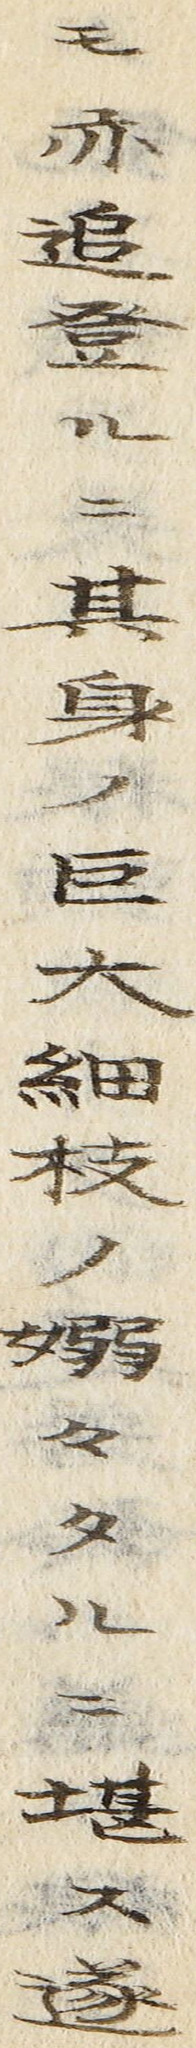モ亦追登ルニ其身ノ巨大細枝ノ嫋々タルニ堪ス遂
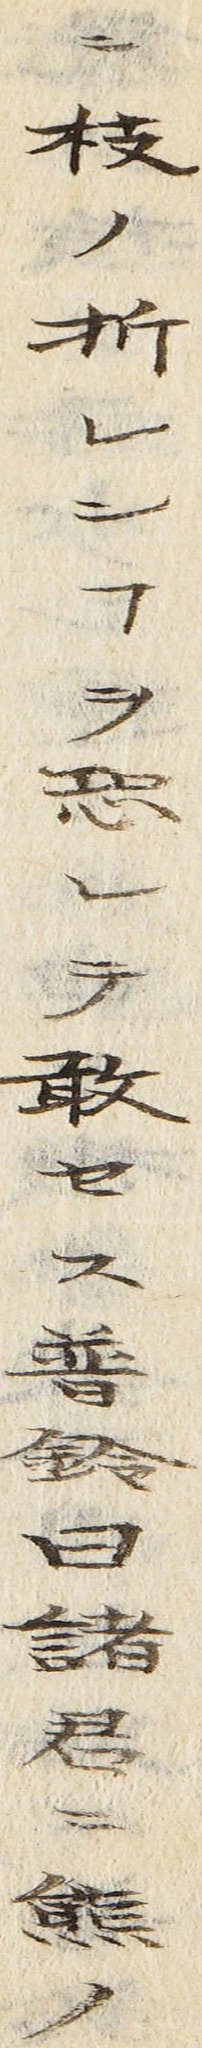ニ枝ノ折レンコトヲ恐レテ敢セス普鈴曰諸君ニ熊ノ
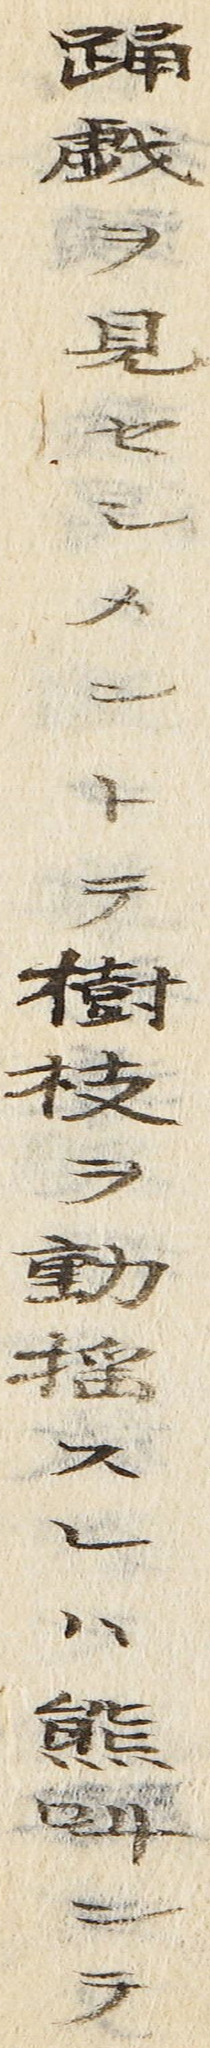踊戯ヲ見セシメントテ樹枝ヲ動揺スレハ熊叫ンテ
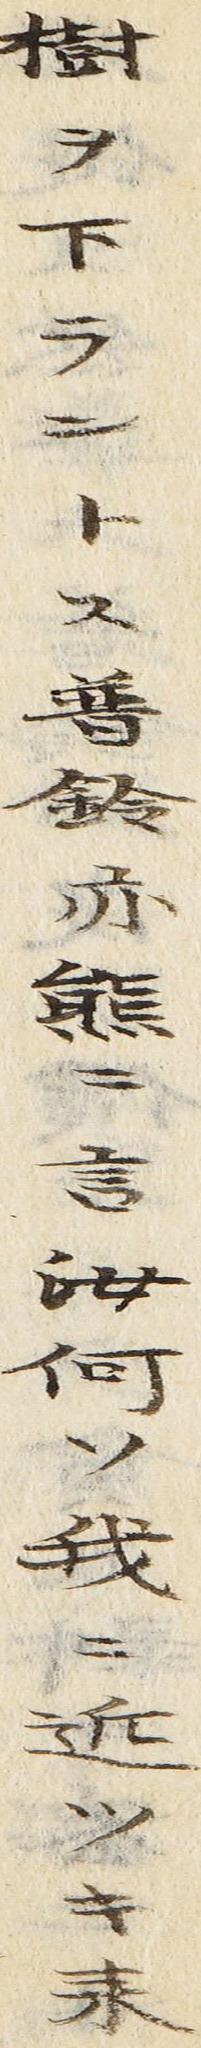樹ヲ下ラントス普鈴亦熊ニ言汝何ソ我ニ近ツキ来
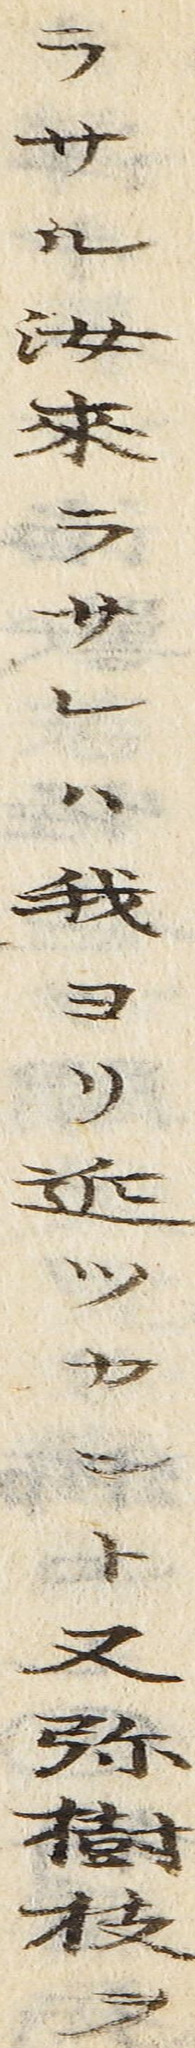ラサル汝来ラサレハ我ヨリ近ツカント又弥樹枝ヲ
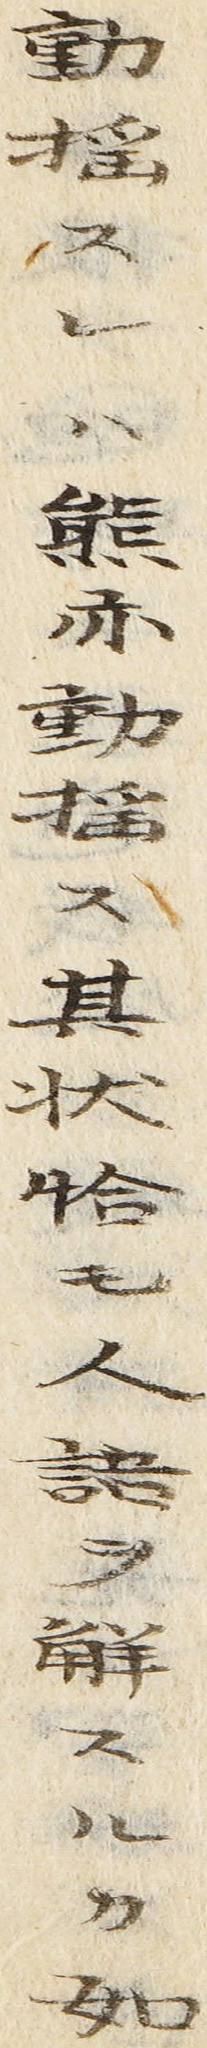動揺スレハ熊亦動揺ス其状恰モ人語ヲ解スルカ如
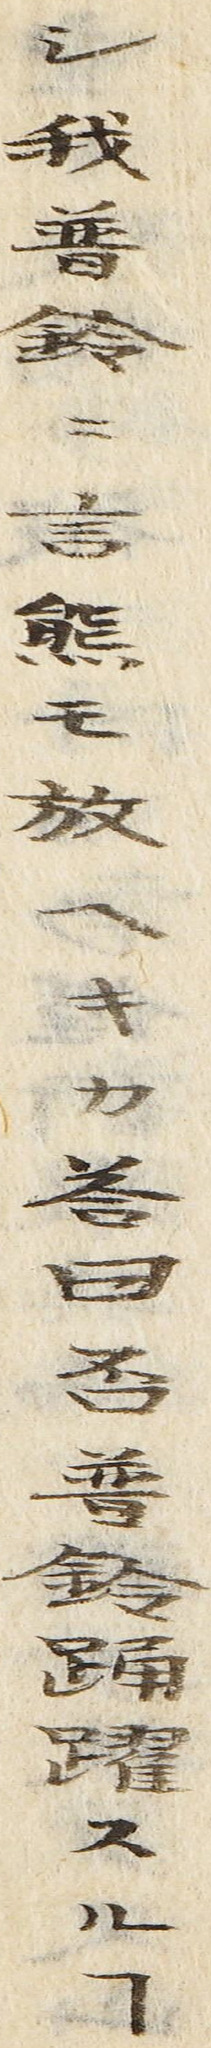シ我普鈴ニ言熊モ放ヘキカ答曰否普鈴踊躍スルコト
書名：漂流紀事
